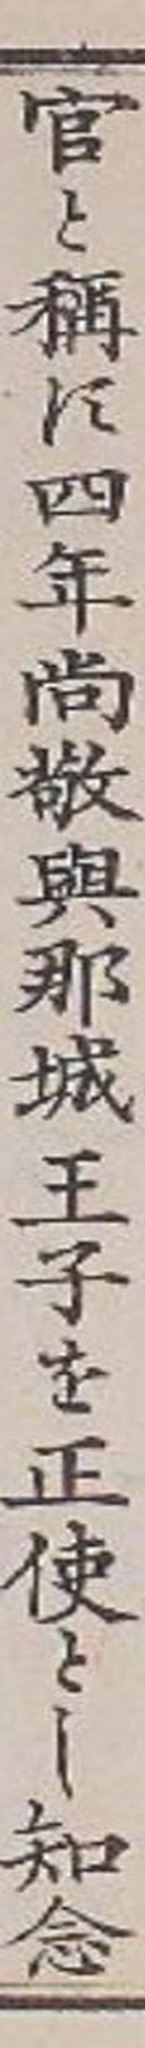官と称す四年尚敬与那城王子を正使とし知念
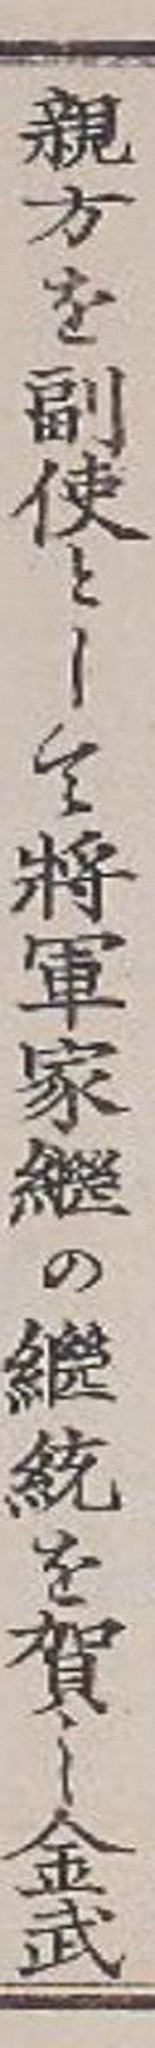親方を副使として将軍家継の継統を賀し金武
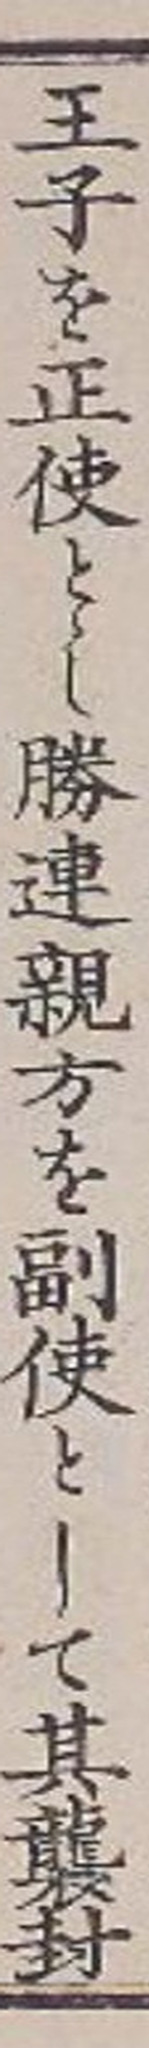王子を正使とし勝連親方を副使として其襲封
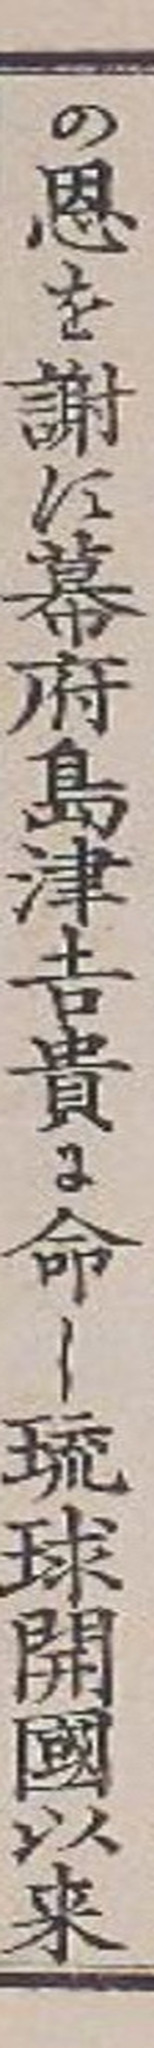の恩を謝す幕府島津吉貴に命し琉球開国以来

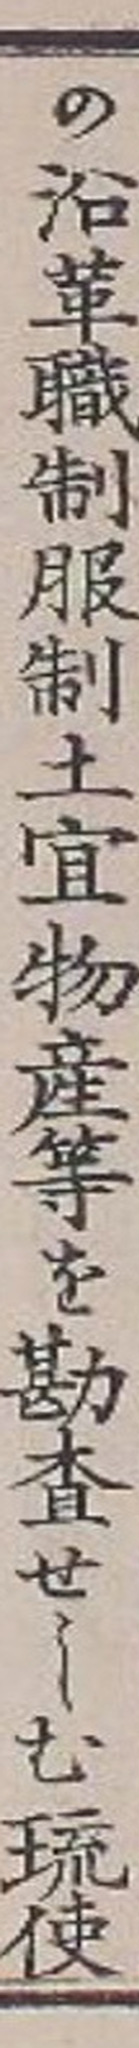の沿革職制服制土宜物産等を勘査せしむ琉使
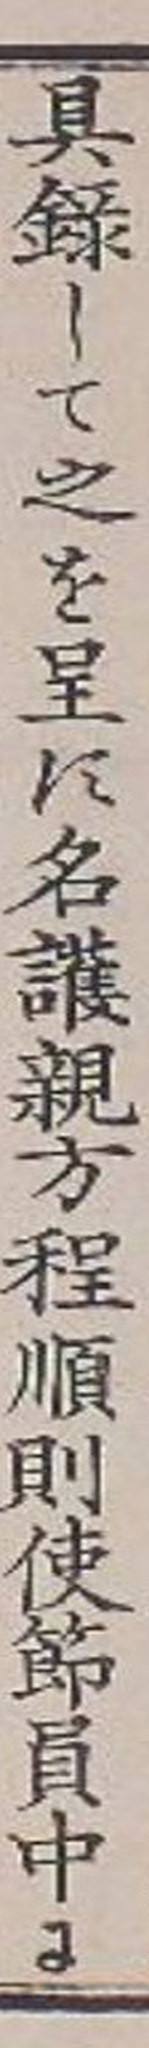具録して之を呈す名護親方程順則使節員中に
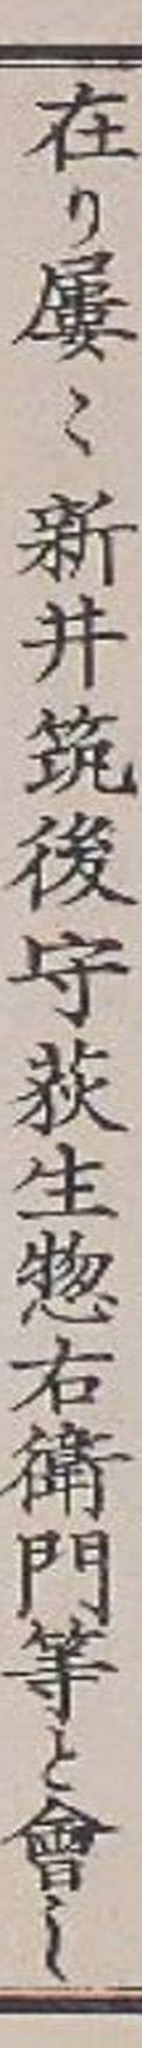在り屡々新井筑後守荻生惣右衛門等と会し
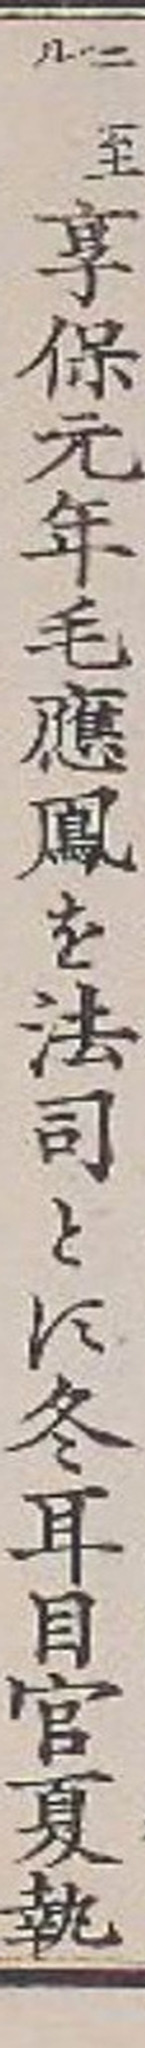ニ至ル享保元年毛応鳳を法司とす冬耳目官夏執
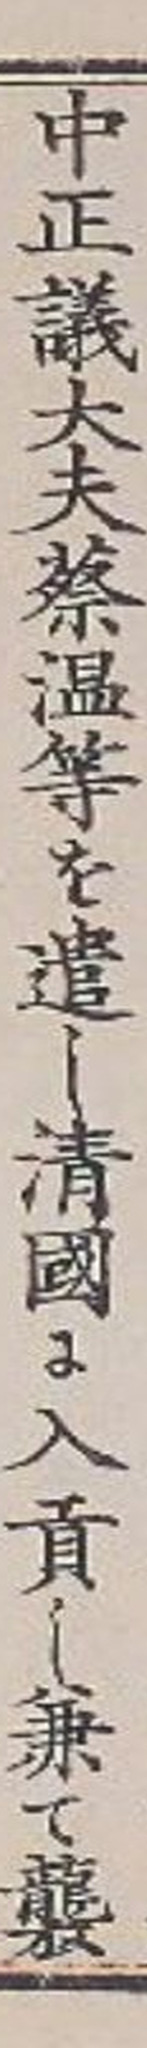中正議大夫蔡温等を遣し清国に入貢し兼て襲
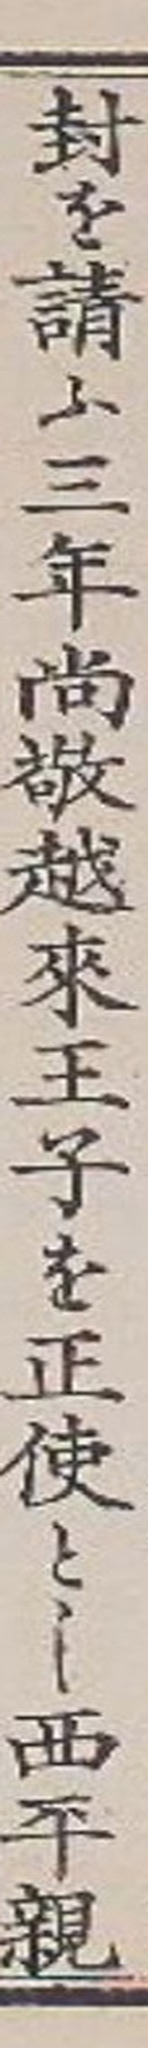封を請ふ三年尚敬越来王子を正使とし西平親
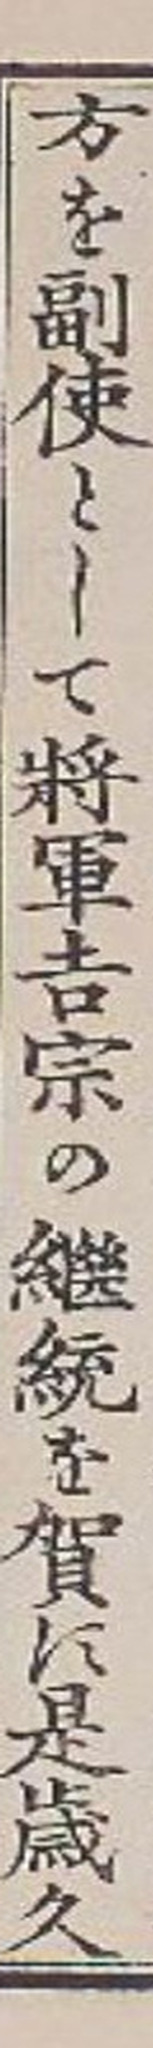方を副使として将軍吉宗の継統を賀す是歳久
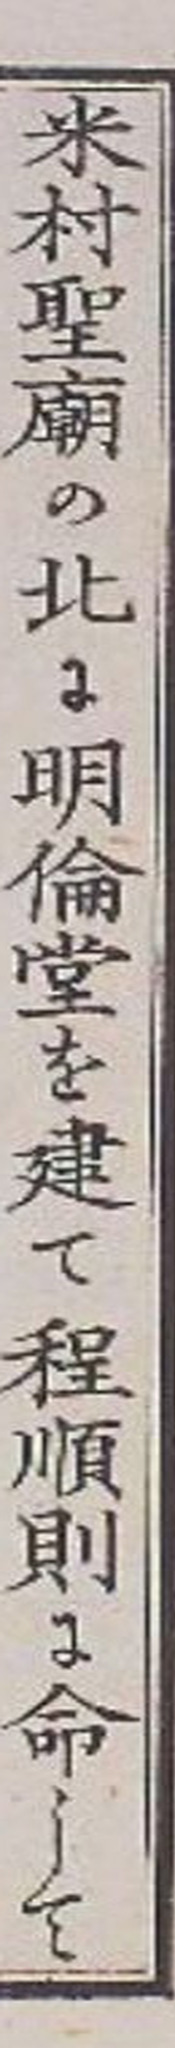米村聖廟の北に明倫堂を建て程順則に命して
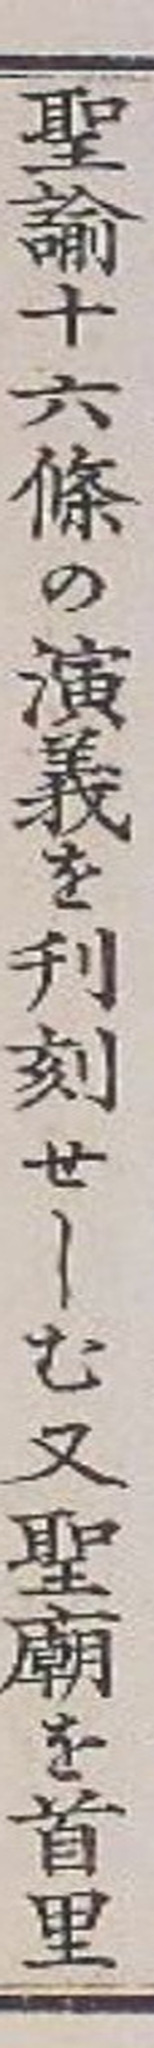聖論十六条の演義を刊刻せしむ又聖廟を首里
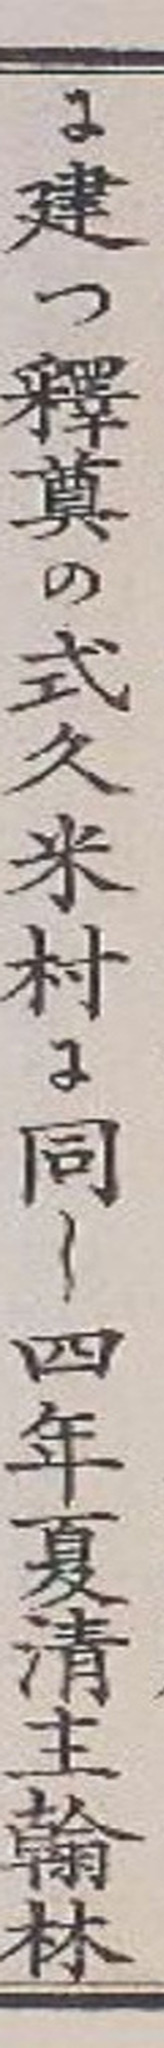に建つ釈莫の式久米村に同し四年夏清主翰林
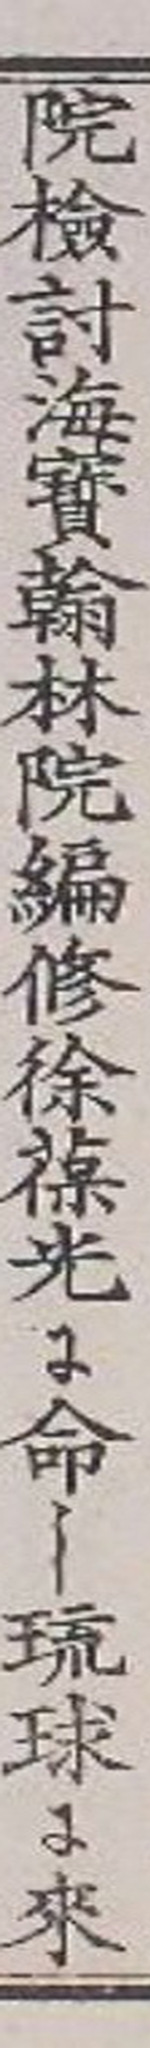院検討海宝翰林院編修徐葆光に命し琉球に来
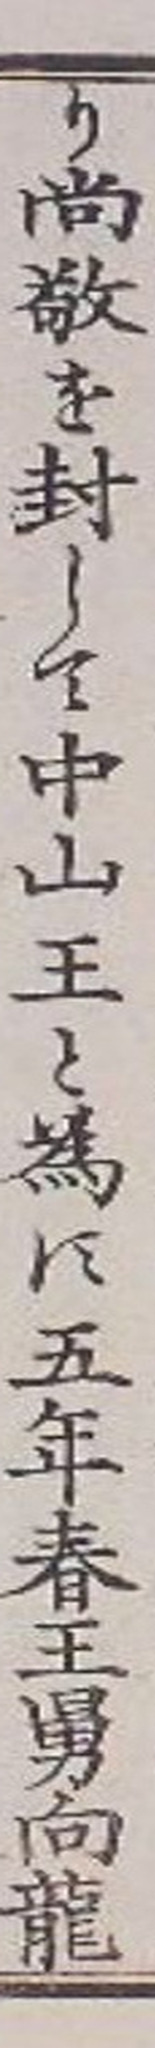り尚敬を封して中山王と為す五年春王舅向龍
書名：南島紀事 下
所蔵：University of the Ryukyus Library
